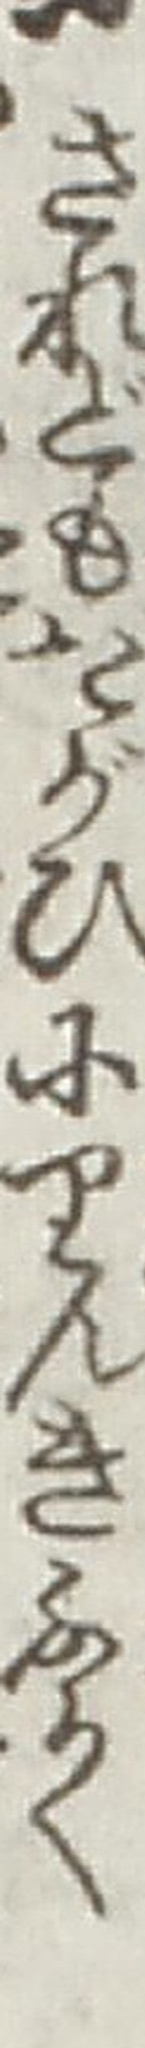されどもたがひにりんきふかく
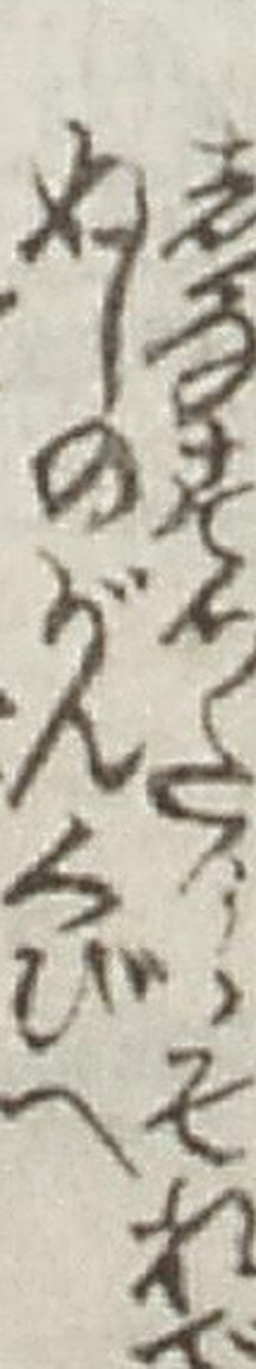ぬしのがんくびへ
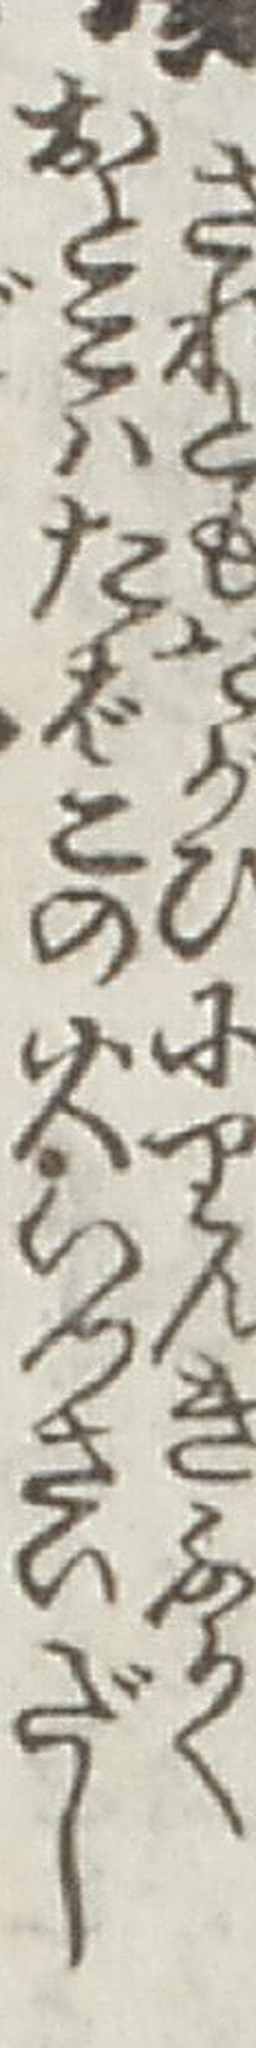おとこはたばこの火いつさいだし
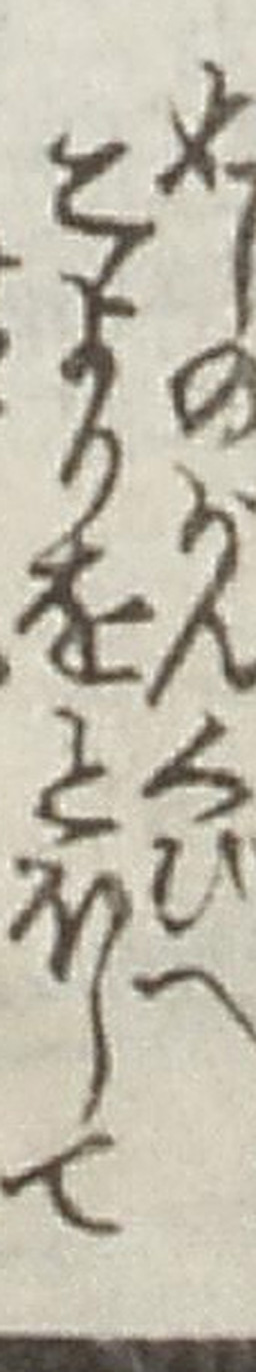こよりをとほして
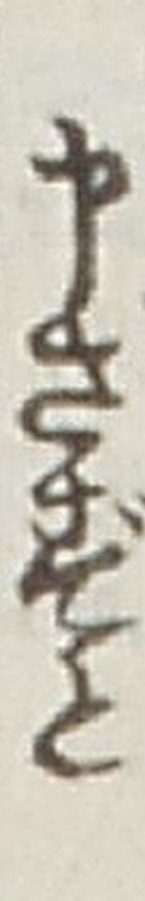申さずと
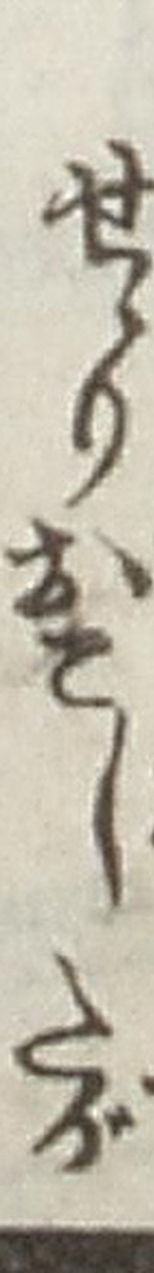せゝりおこしたが
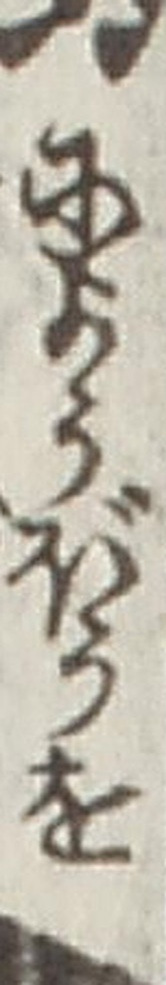にようぼうを
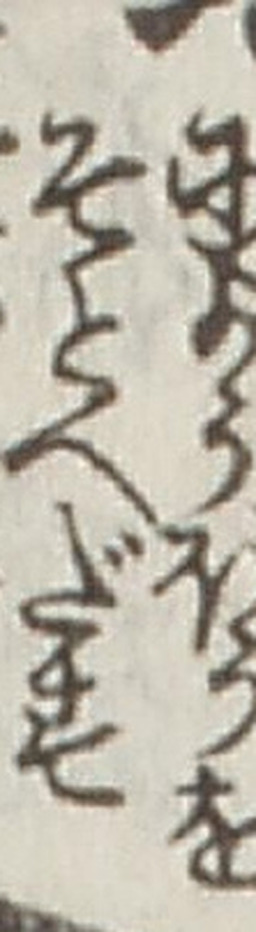そとへだす
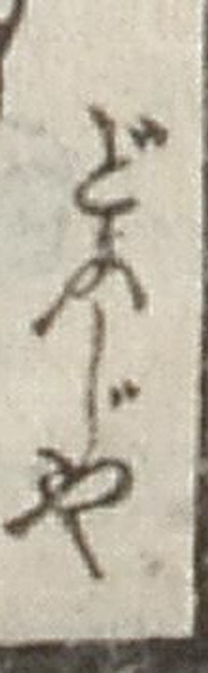どふじや
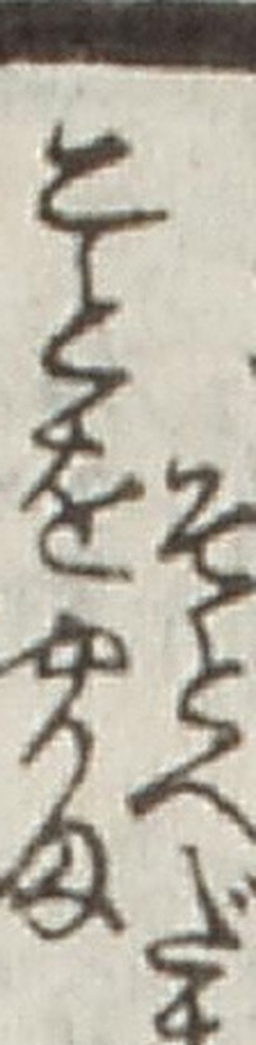ことをやかま
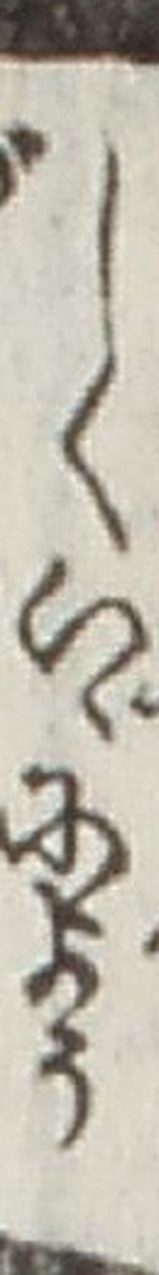しくいゝによう
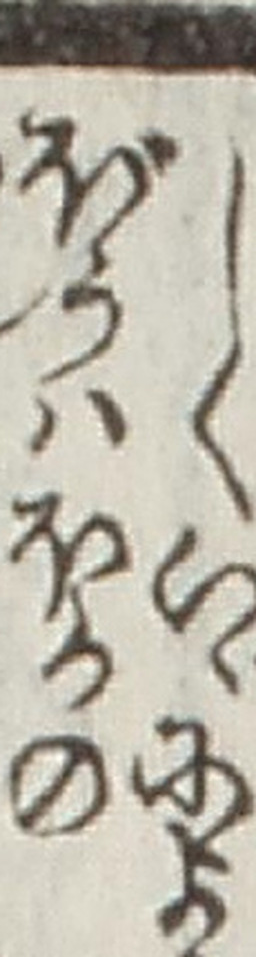ぼうはほかの
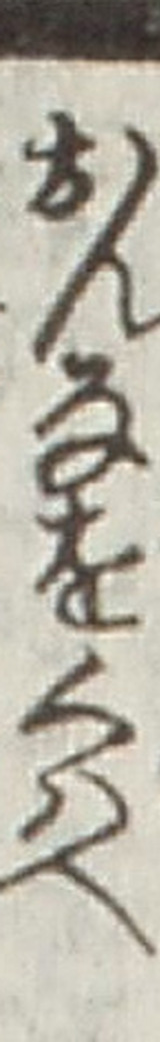おんなをくはへ
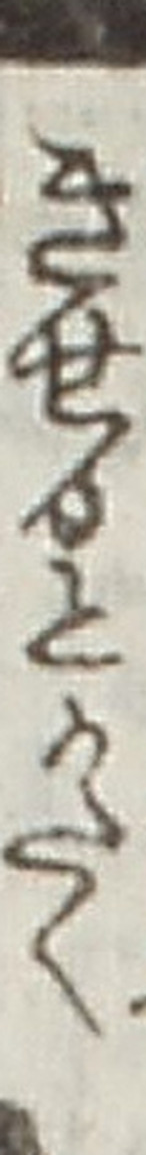きせるとかたく
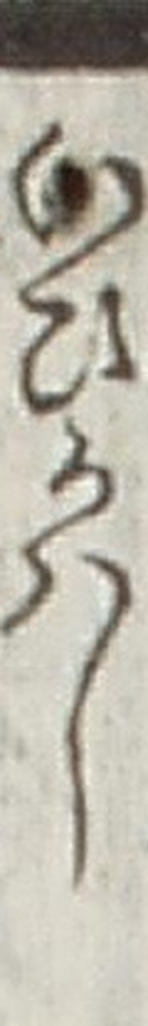いひかはし
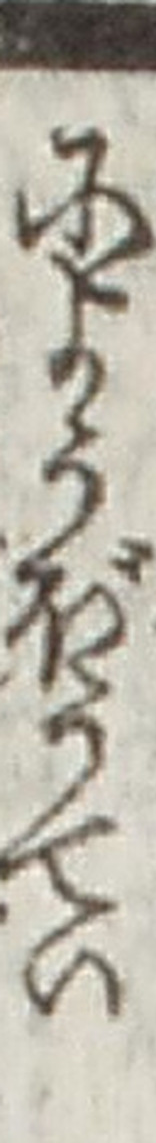にようぼうてい
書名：三世相出雲當座帳　上下冊
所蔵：東京大学地震研究所図書室 Earthquake Research Institute Library, The University of Tokyo, JAPAN
